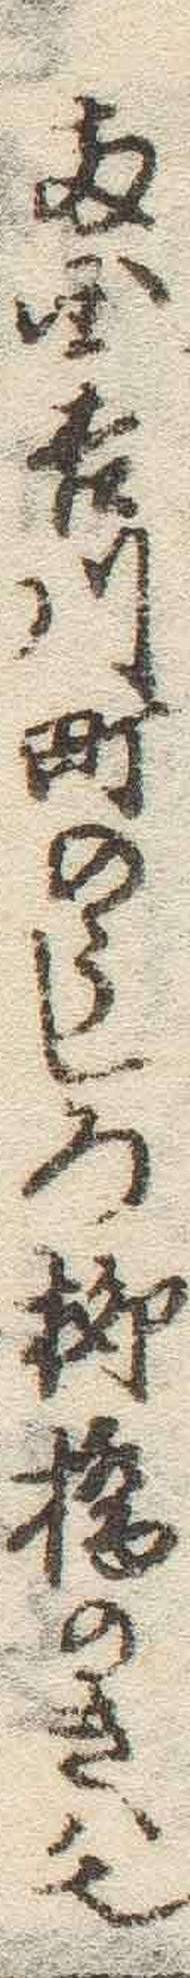両国吉川町のうしろ柳橋のきは也
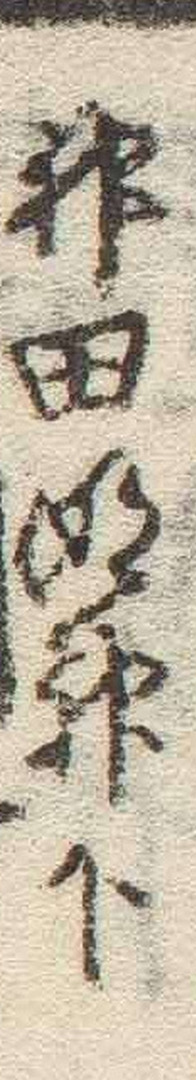神田明神下
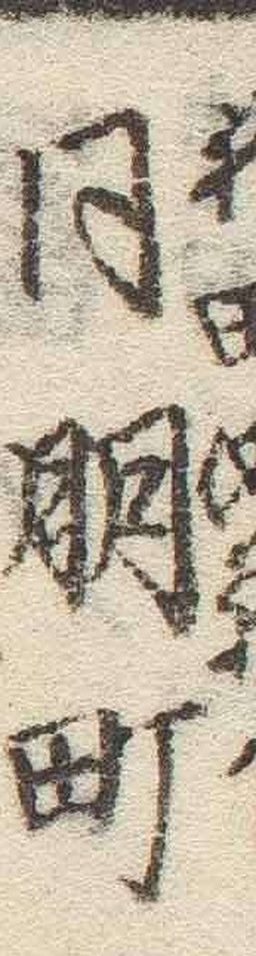同朋町
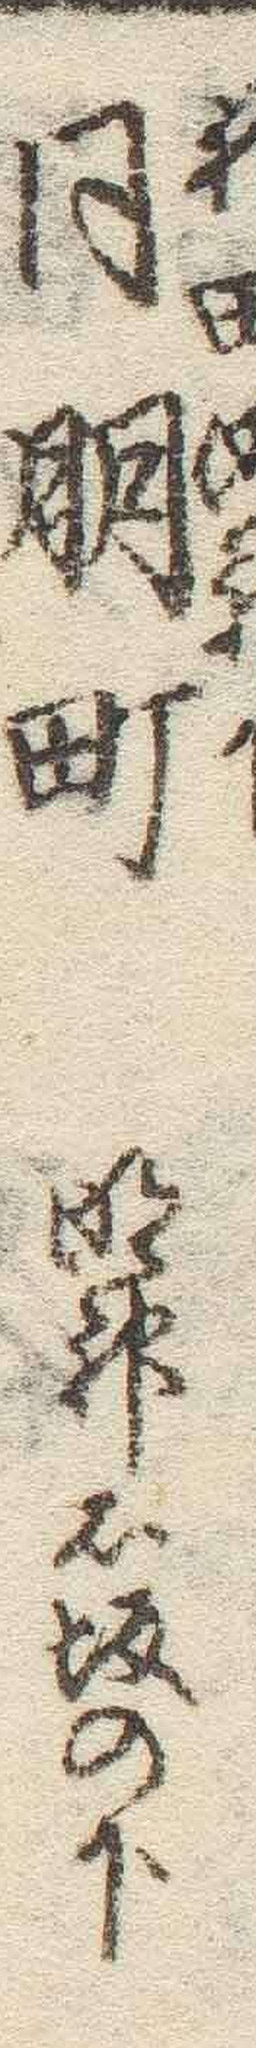同朋町明神石坂の下
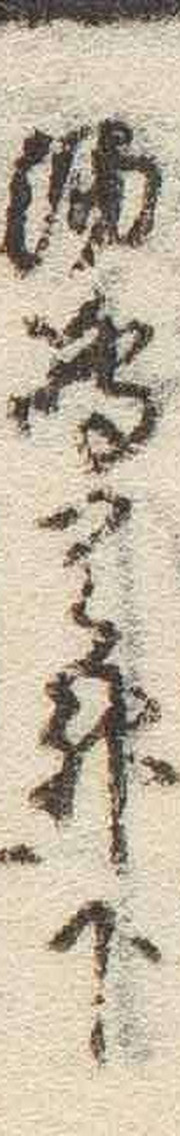湯島天神下
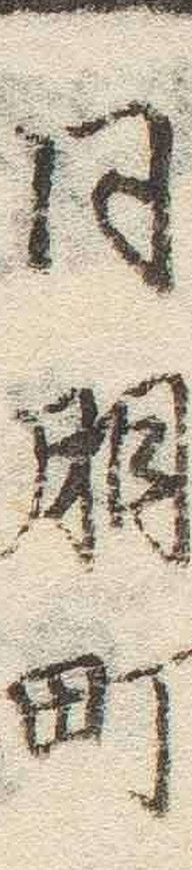同朋町
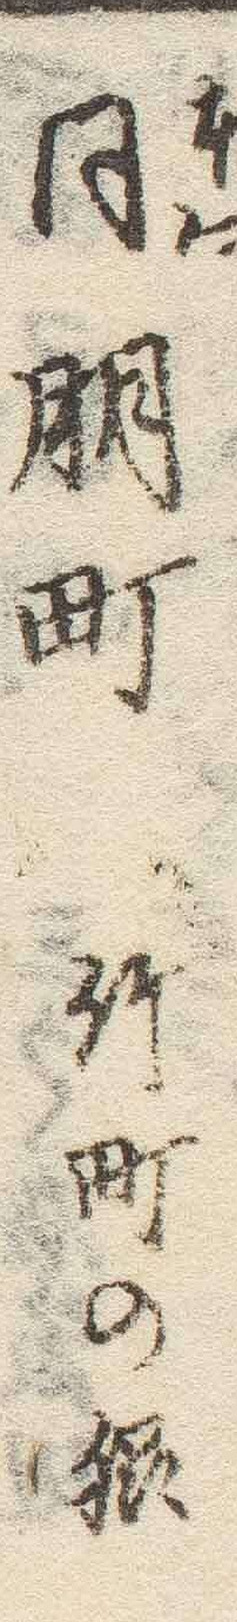同朋町竹町の脇
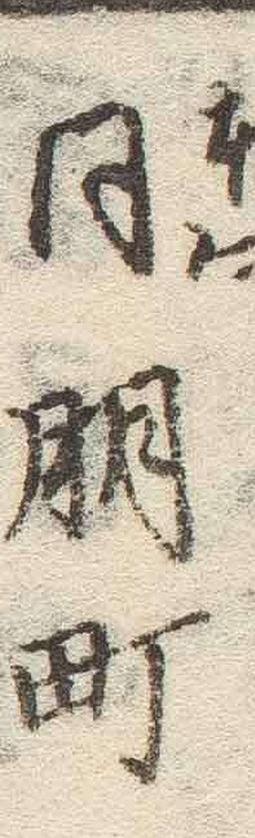同朋町
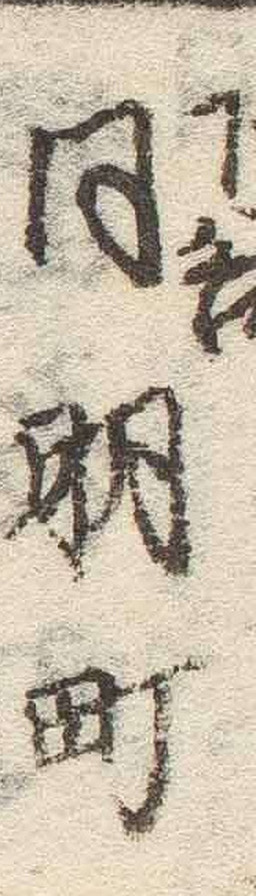同朋町
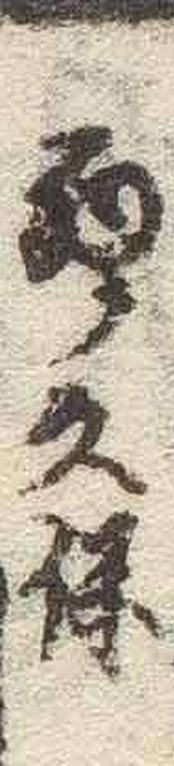西ノ久保
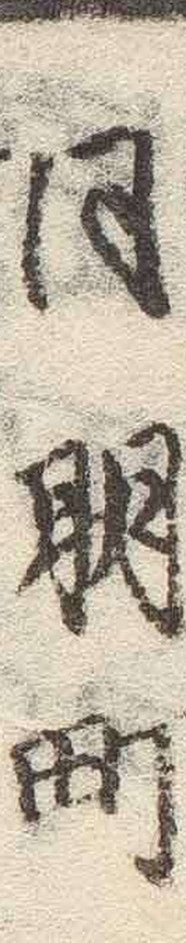同朋町
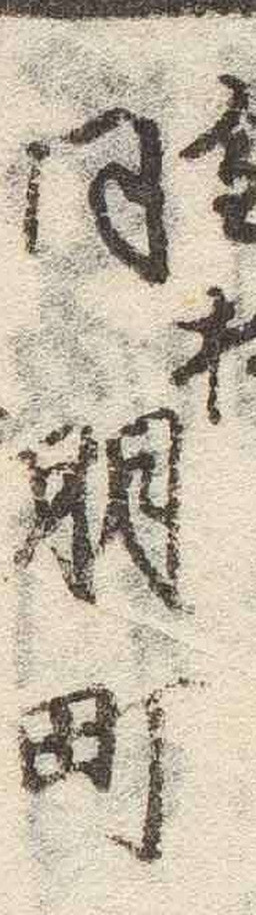同朋町
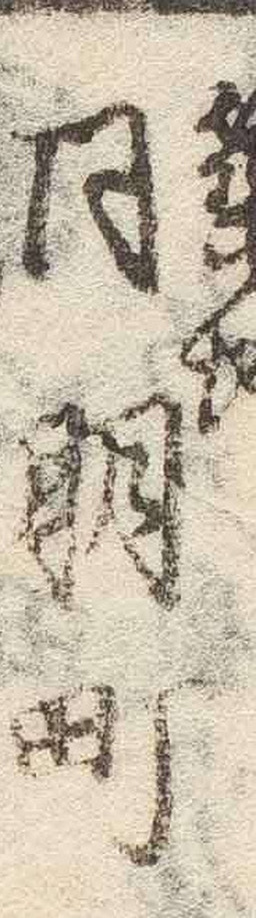同朋町
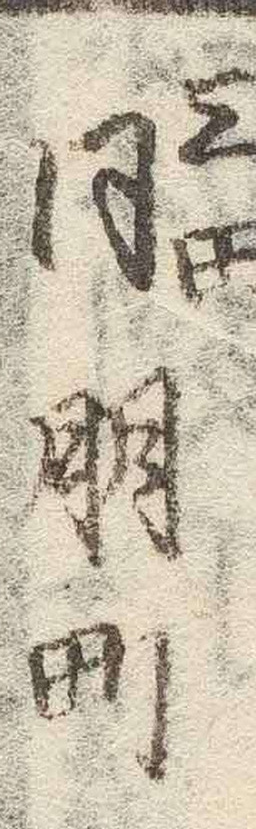同朋町
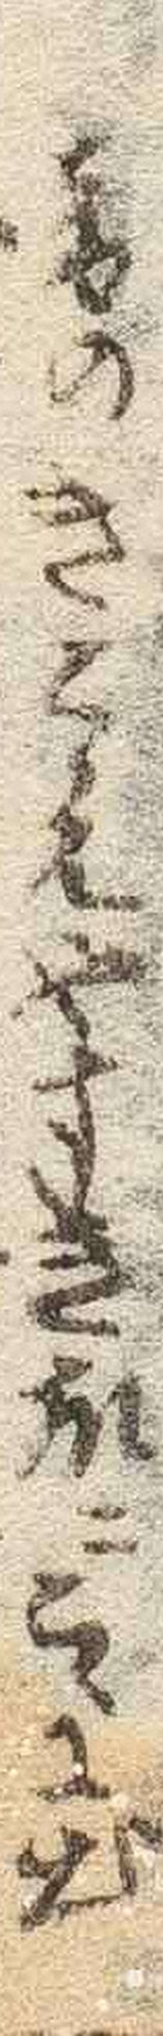音のきこえやすき故にこゝに出
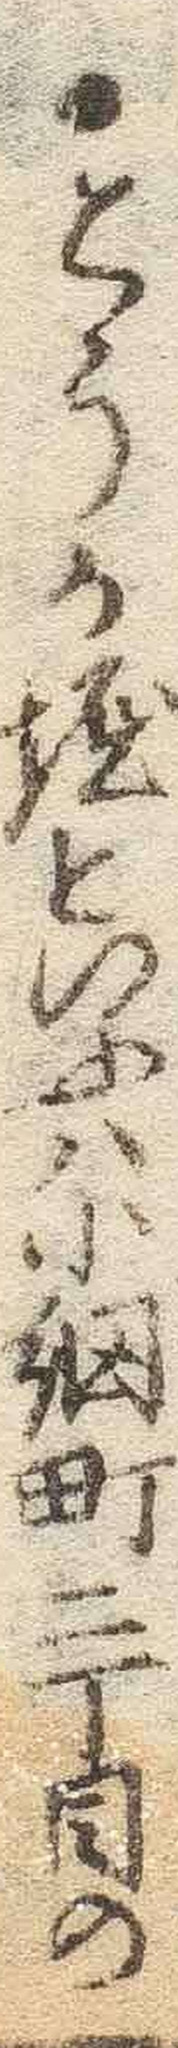・とうか堀といふは小網町二丁目の
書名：江戸町独案内
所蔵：東京学芸大学附属図書館 国文学研究資料館
